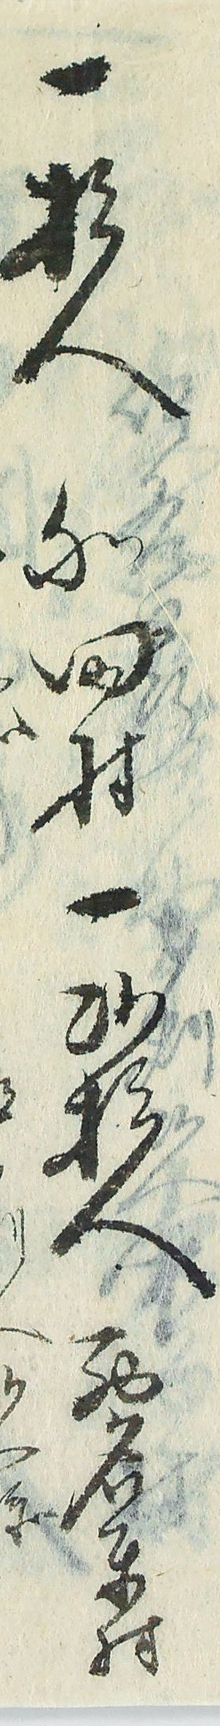一拾人和田村一弐拾人西名東村
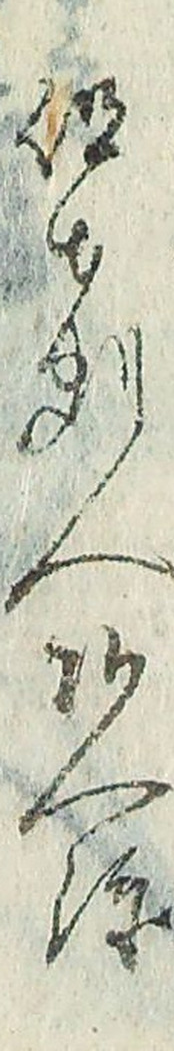但才判人弐人添
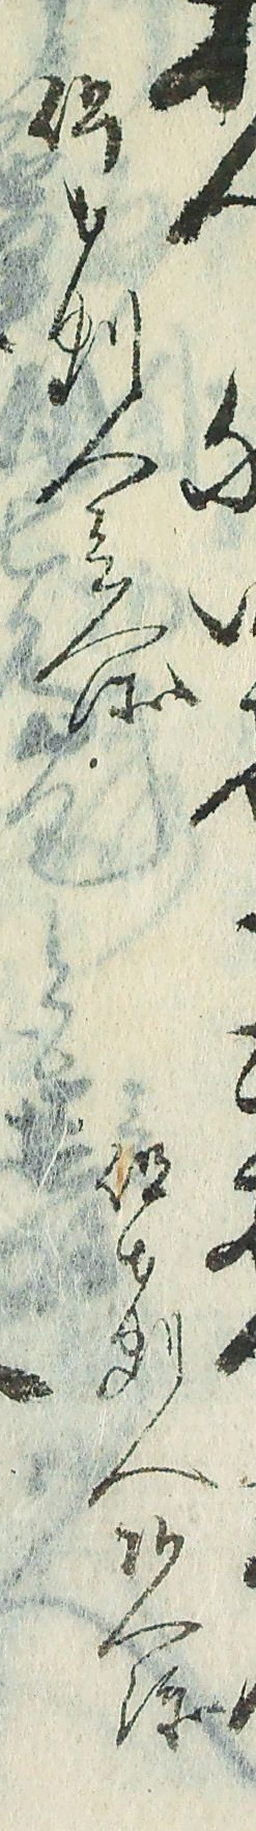但才判人壱人添但才判人弐人添
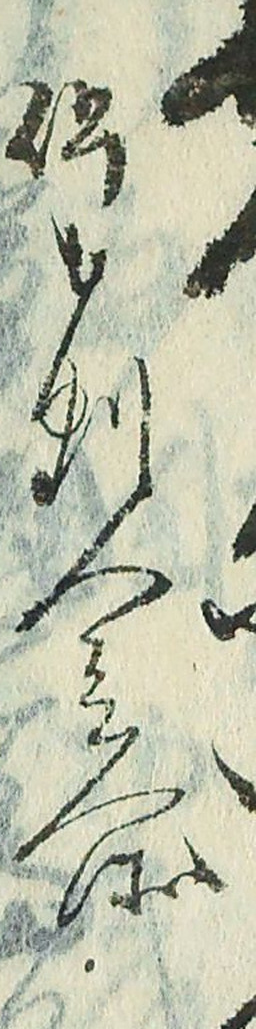但才判人弐人添
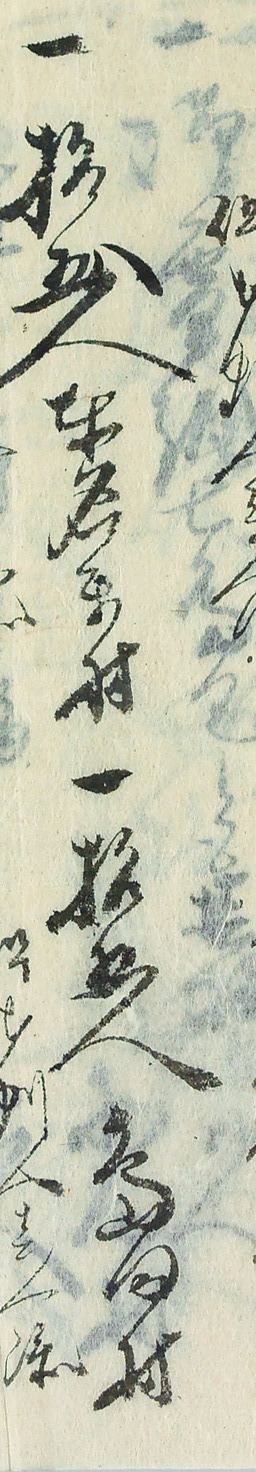一拾五人東名東村一拾五人島田村
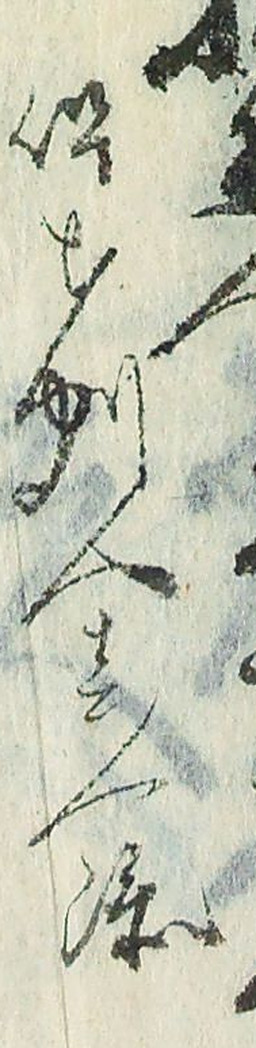但才判人弐人添
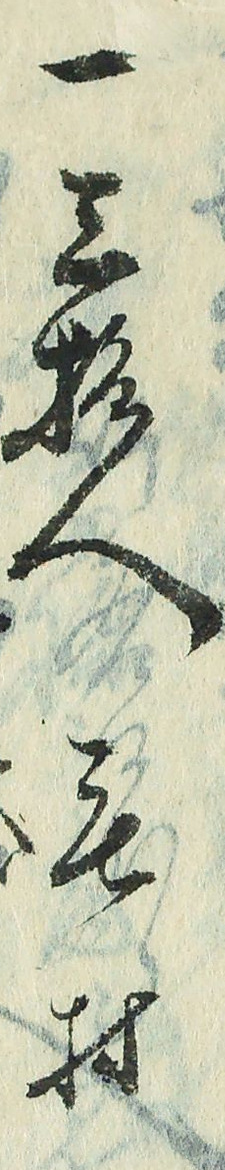一三拾人庄村
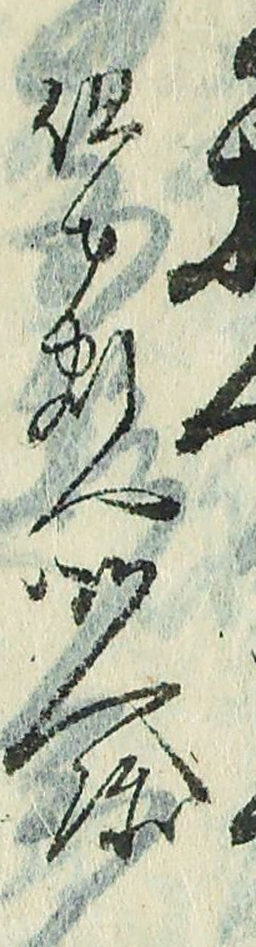但才判人弐人添
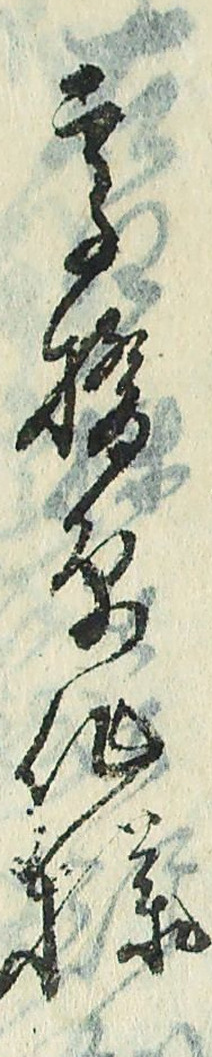高橋平作様
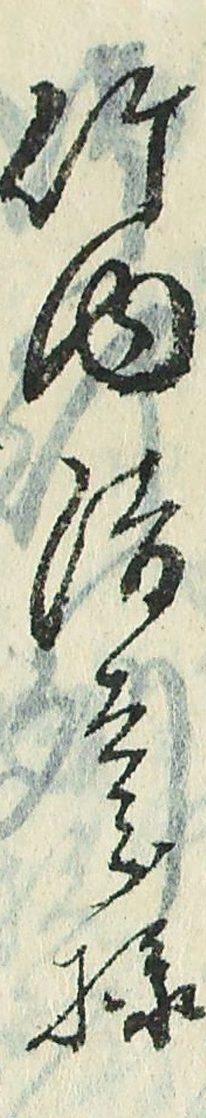竹内清太郎様
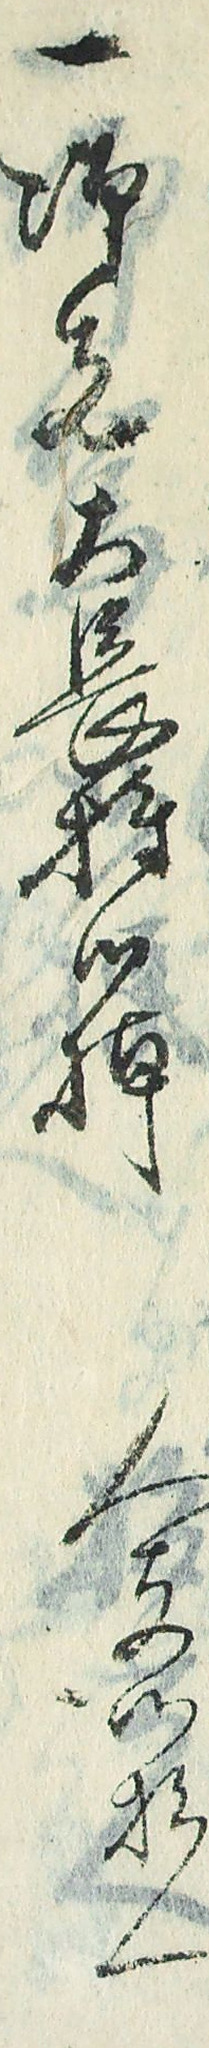一御先大長持弐棹人夫弐拾人

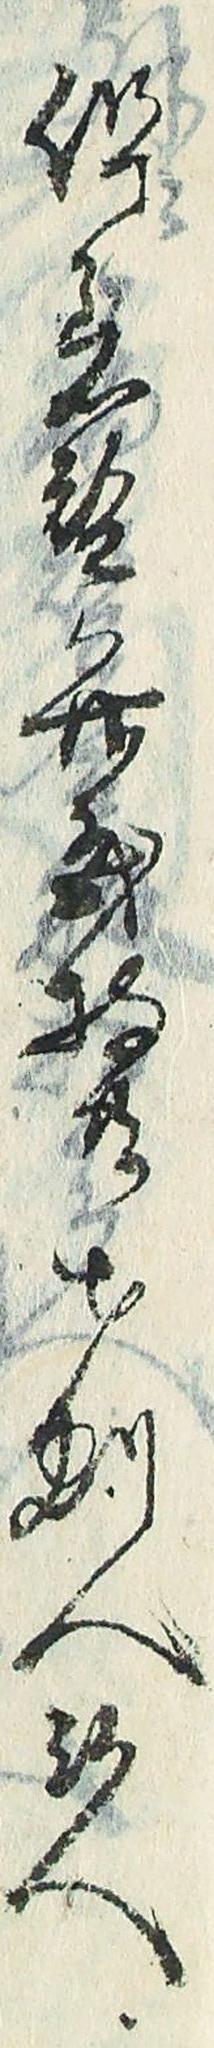但着替弁当持共才判人弐人
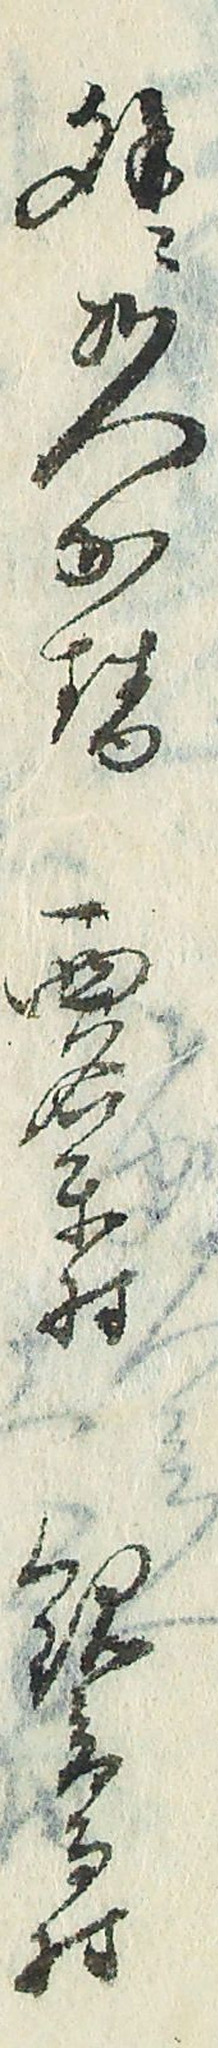外に弐人加勢西名東村観音寺村
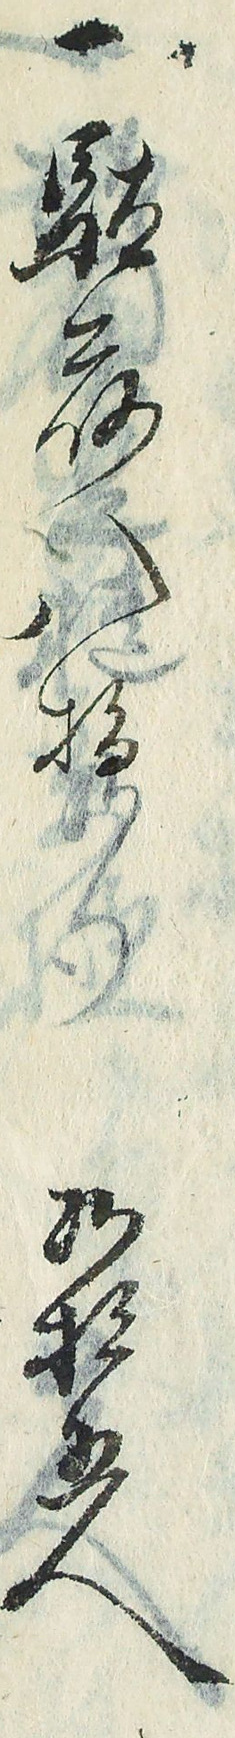一駄荷八拾弐拾五人
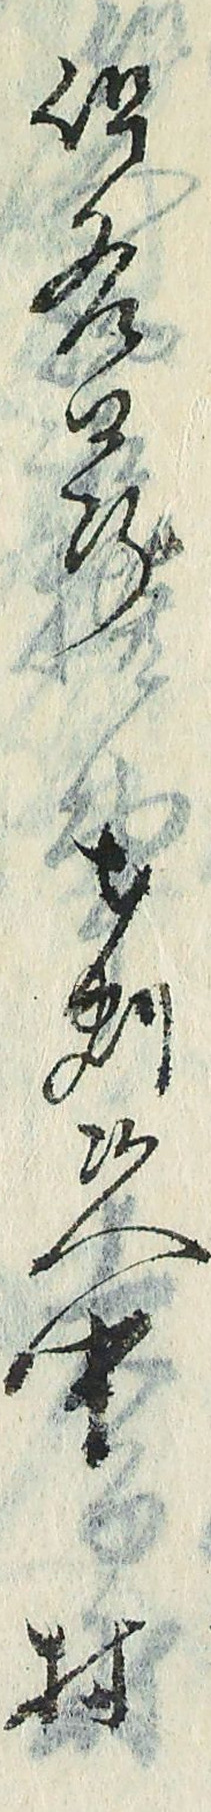但右同断才判弐人中村
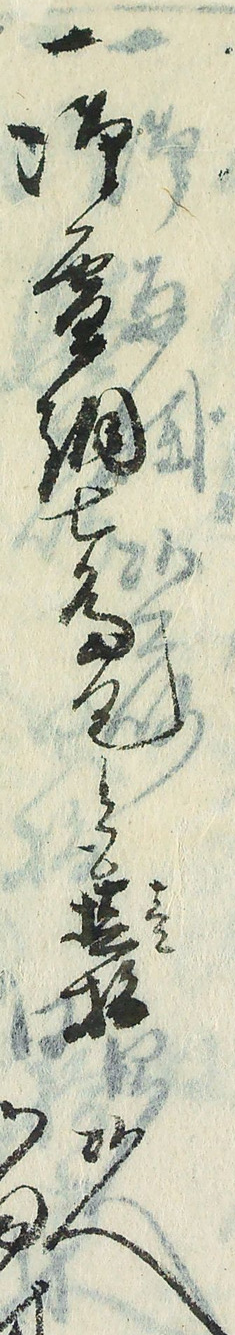一御雪洞七島包とも壱指弐人
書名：公辺御役人為御廻浦御立越諸御用一巻
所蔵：鳴門教育大学 Naruto University of Education
